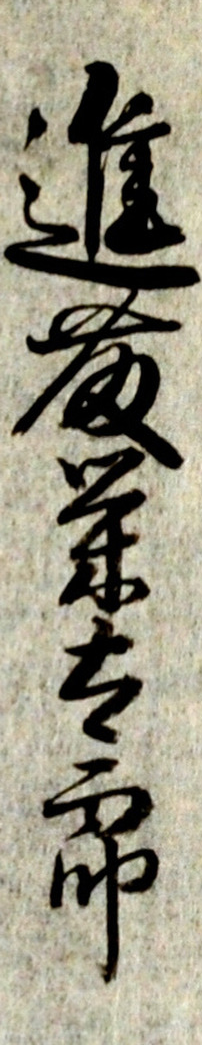進藤栄太郎
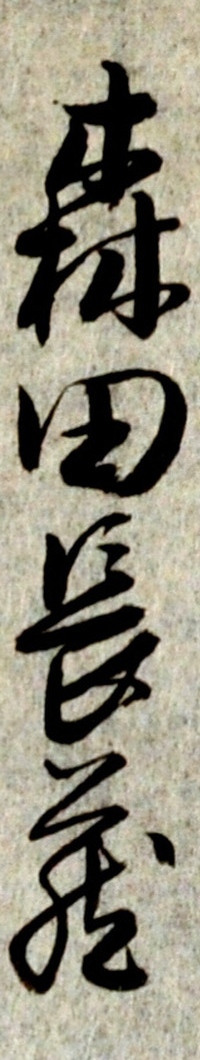森田長蔵
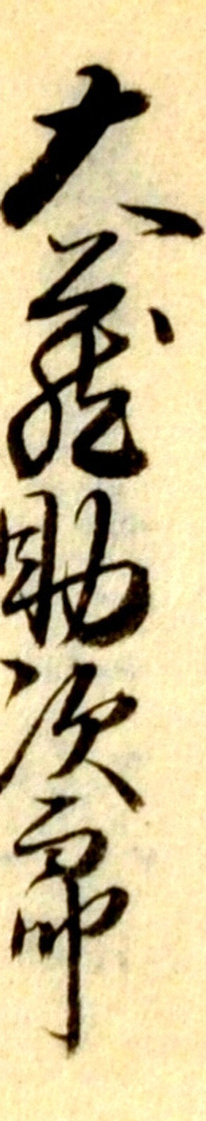大蔵助次郎

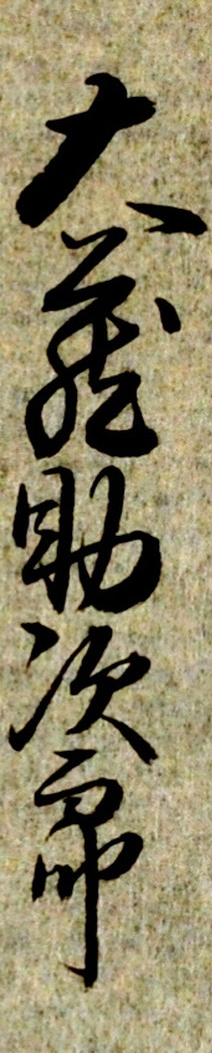大蔵助次郎
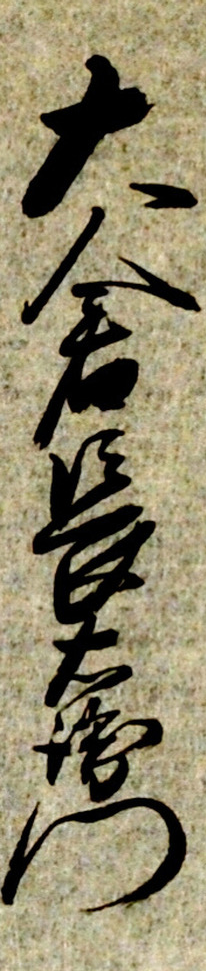大倉長右衛門
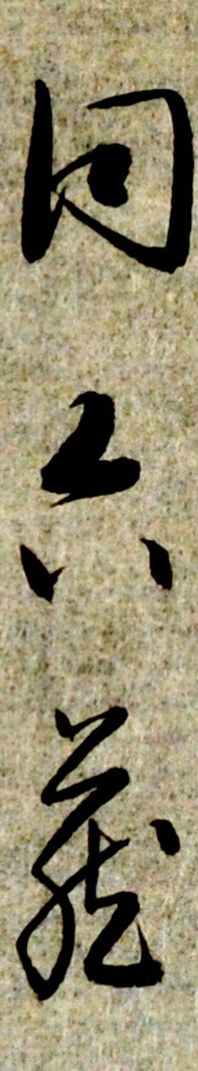同六蔵
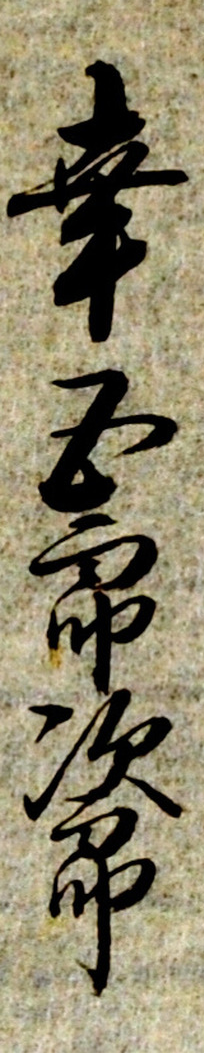幸五郎次郎
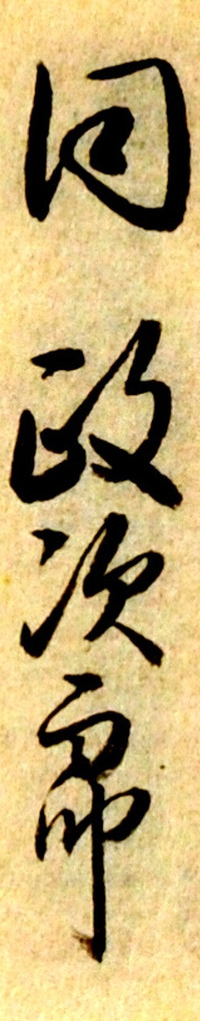同政次郎
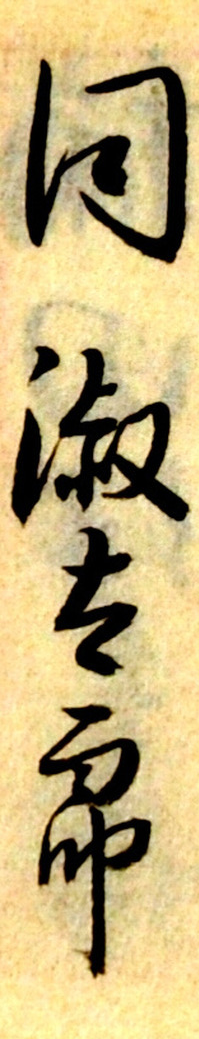同淑太郎

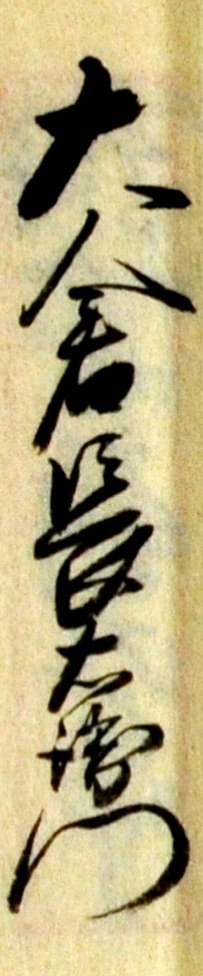大倉長右衛門
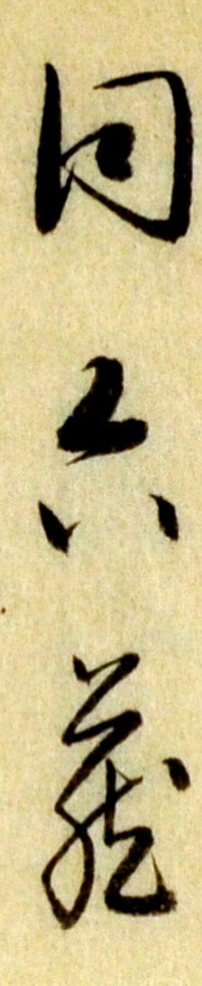同六蔵
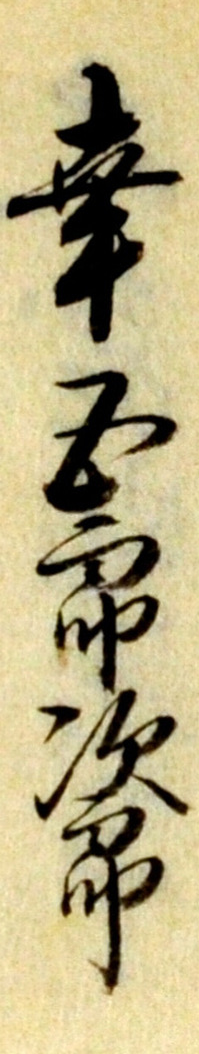幸五郎次郎
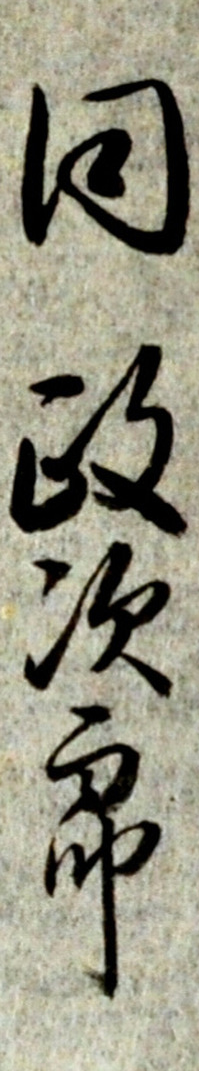同政次郎
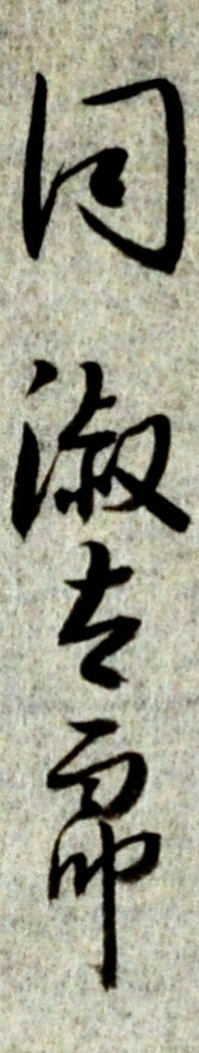同淑太郎
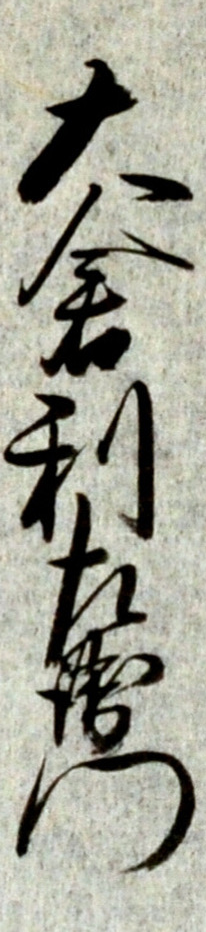大倉利左衛門
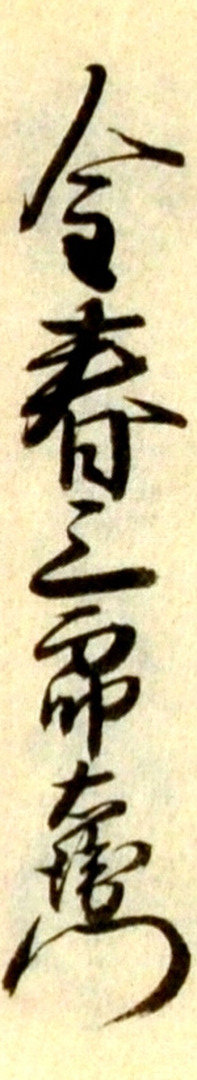金春三郎右衛門
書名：若年寄御役中御調書付
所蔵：伊那市立高遠町図書館・合同会社AMANE
